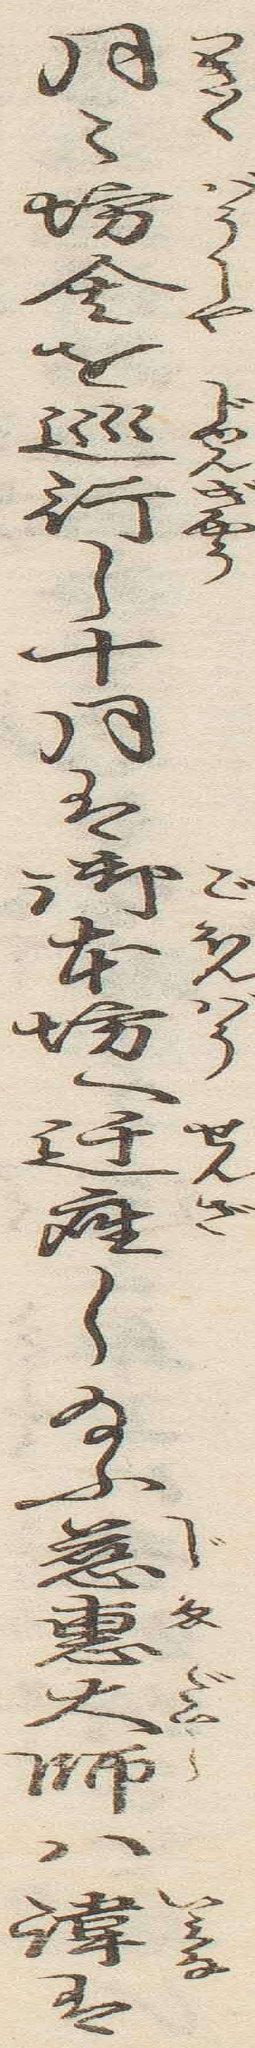月〻坊舎を巡行し十月は御本坊へ迁座し給ふ慈恵大師は諱は
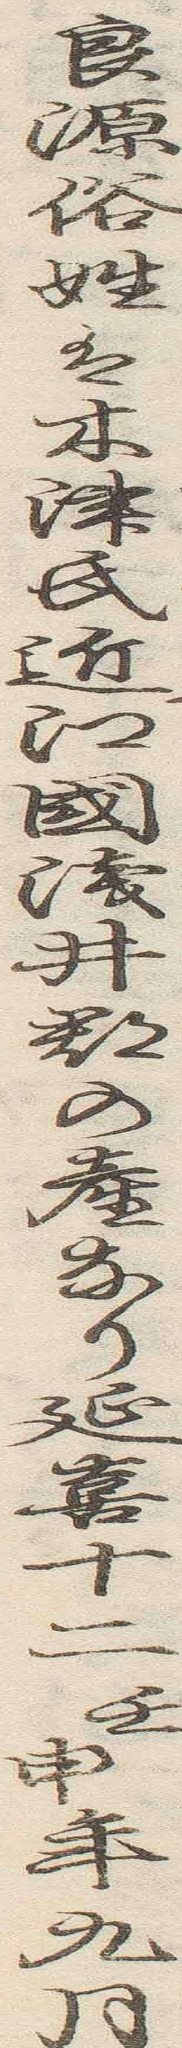良源俗姓は木津氏近江國浅井郡の産なり延喜十二壬申年九月
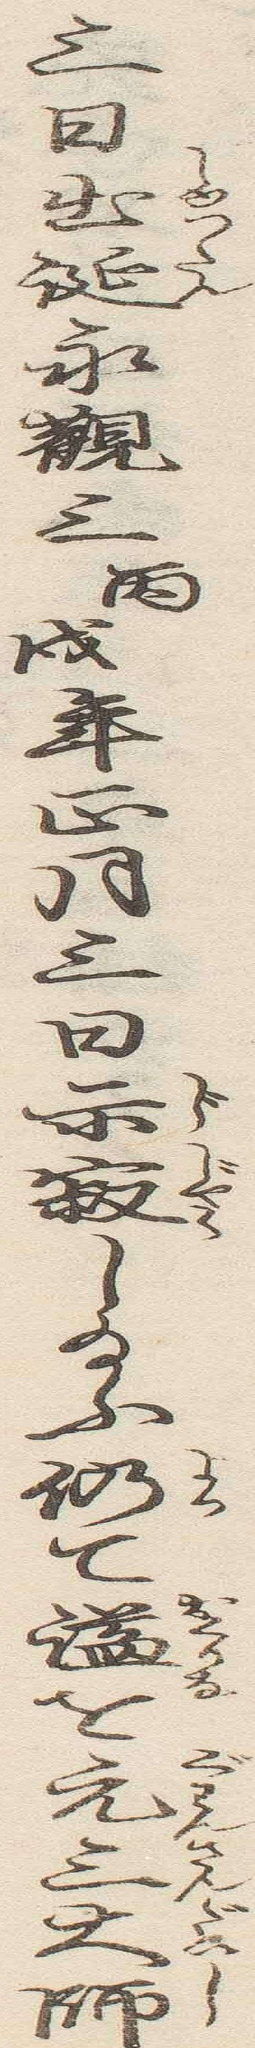三日出誕永觀三丙戌年正月三日示寂し給ふ仍て諡を元三大師
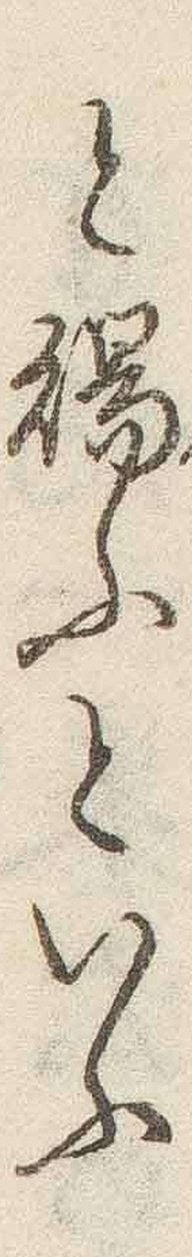と賜ふといふ
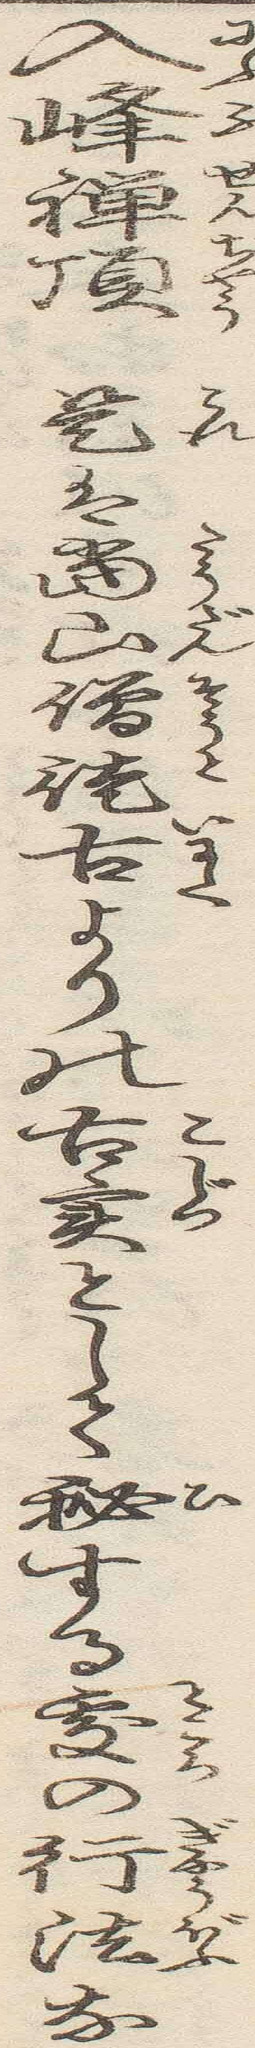入峰禅頂是は當山僧徒古よりの古実として秘する處の行法な
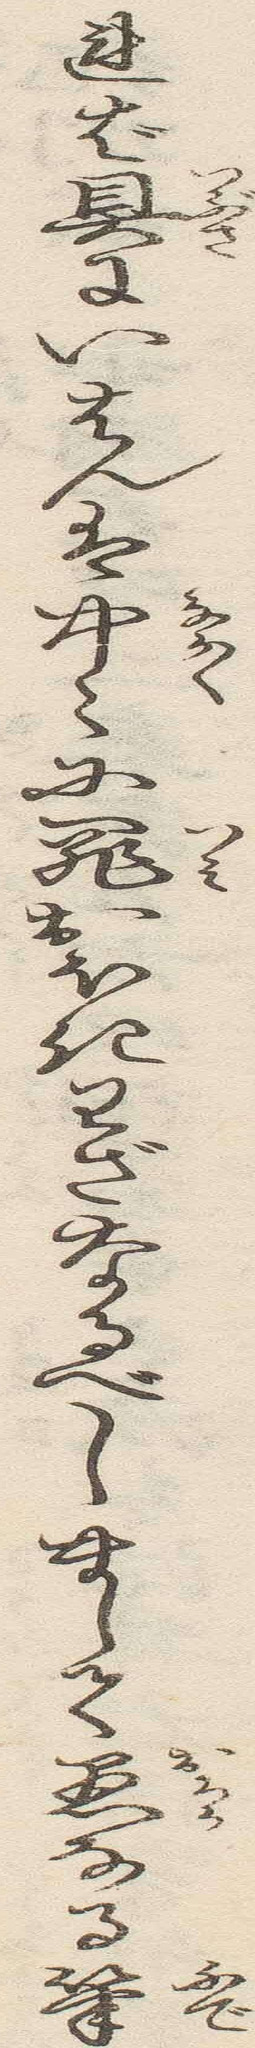れば具にいはんは中〻に罪おほきわざなるべしまして愚なる筆
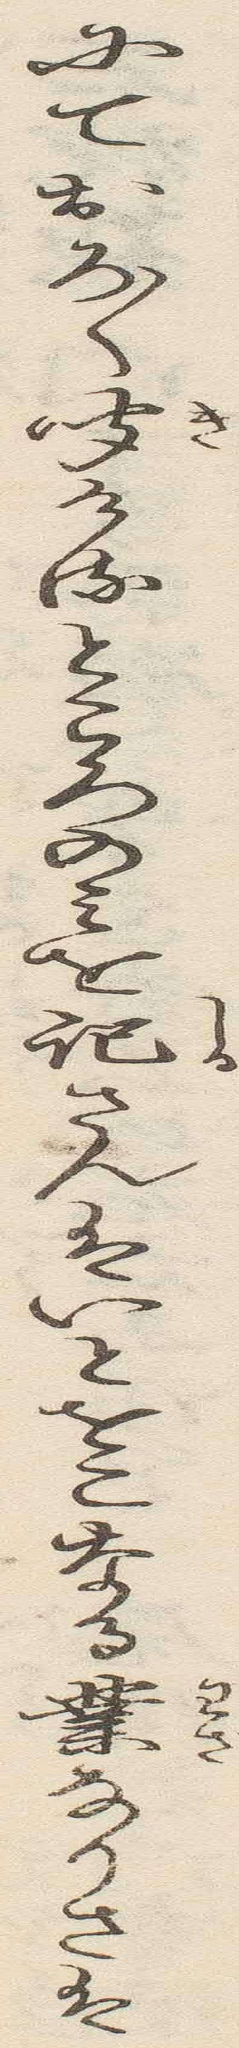にておろ〳〵聞けるところのみを記さんはいとをこなる業なりさは
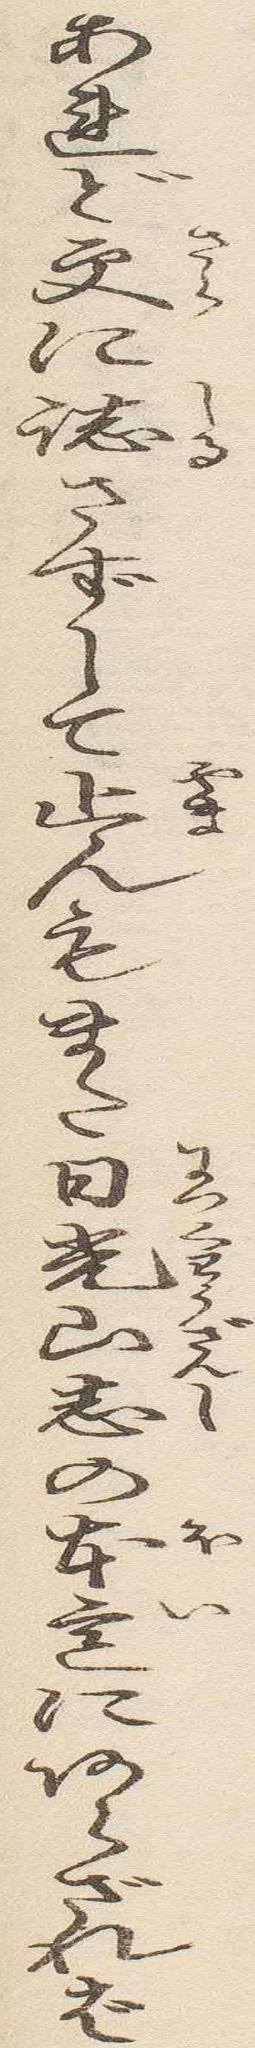あれど更に誌さずして止んもまた日光山志の本意にあらざれば
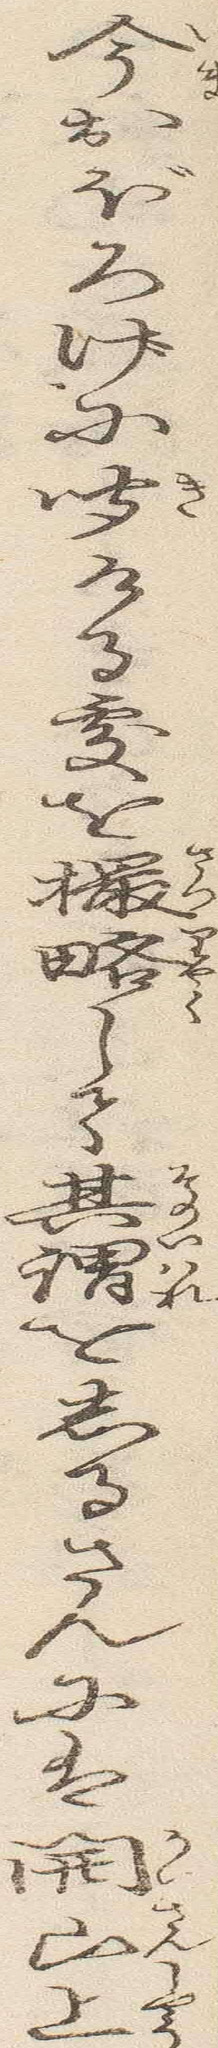今おぼろげに聞ける處を撮略して其謂をしるさんには開山上
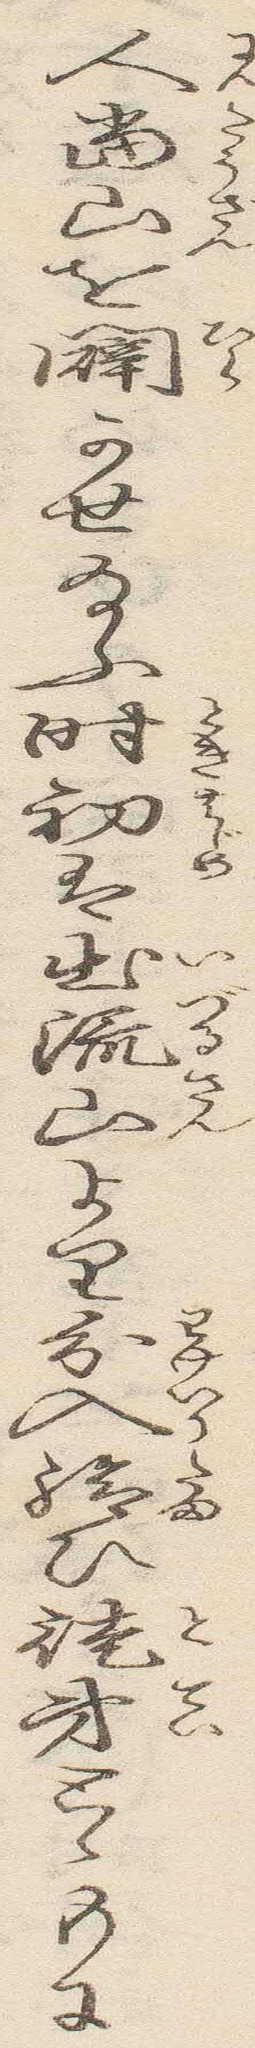人當山を闢かせ給ふ时初は出流山より分入給ひ徒㐧とゝもに
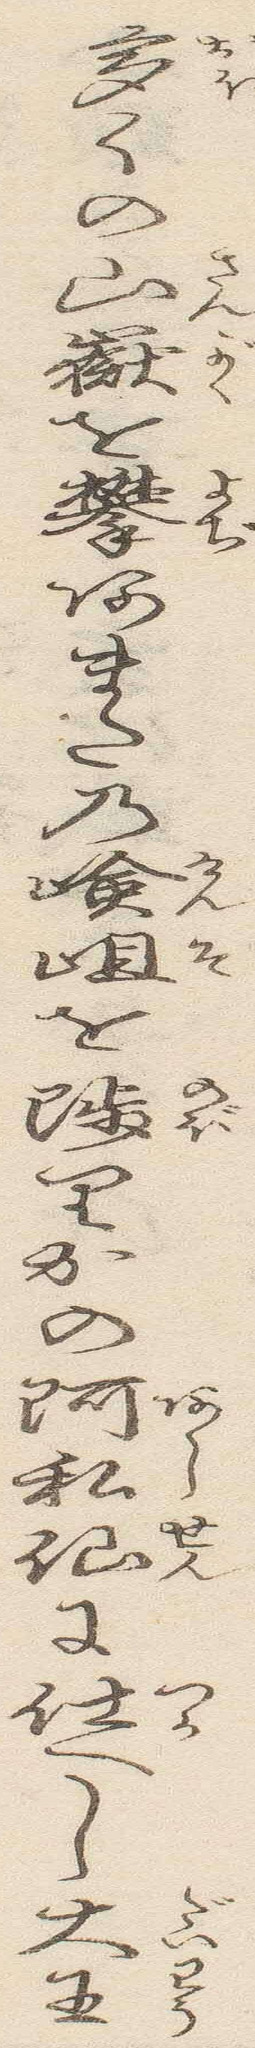多くの山嶽を攀あまたの𡸴岨を陟りかの阿私仙に仕へし大王
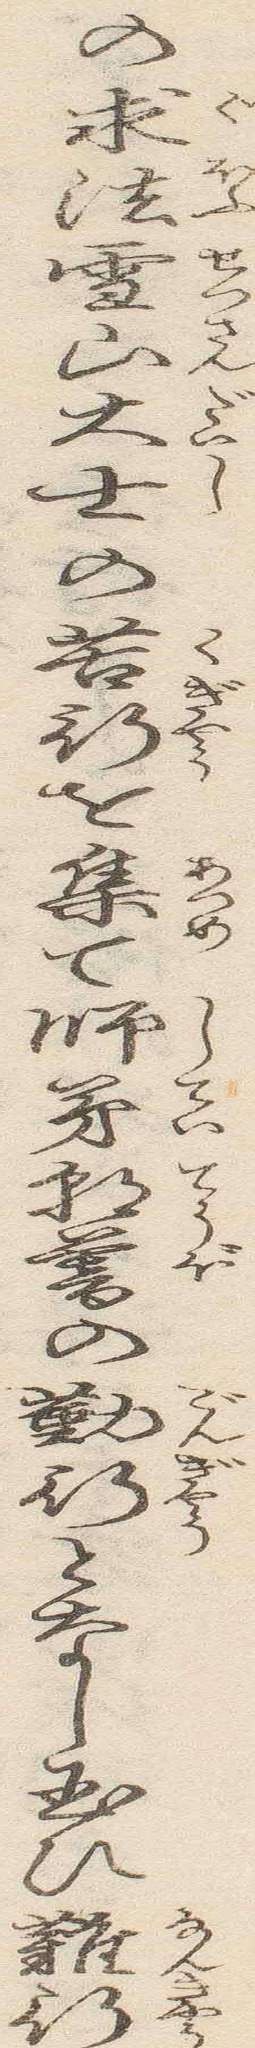の求法雪山大士の苦行を集て師弟朝暮の勤行となし玉ひ難行
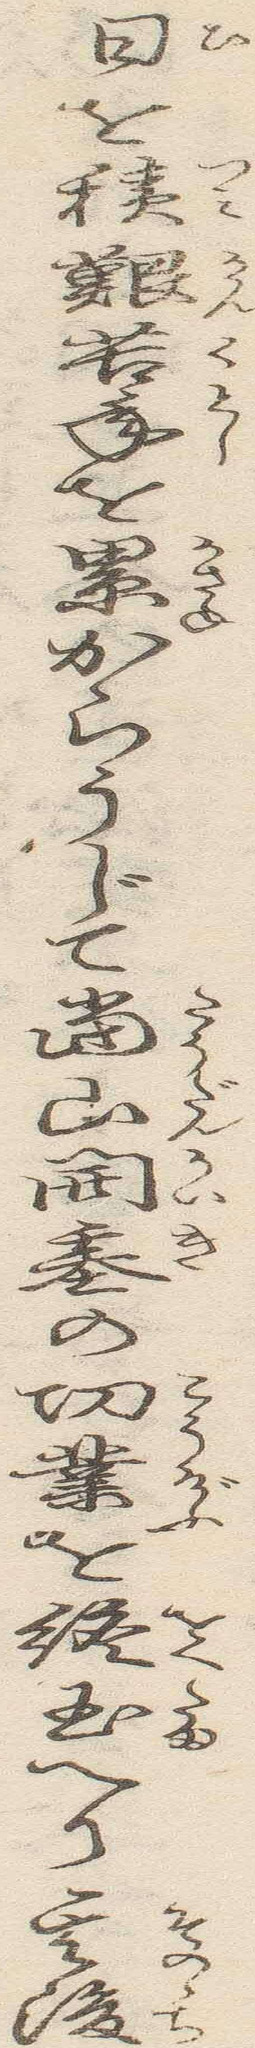日を積艱苦年を累からうじて當山開基の㓛業を終玉へり其後
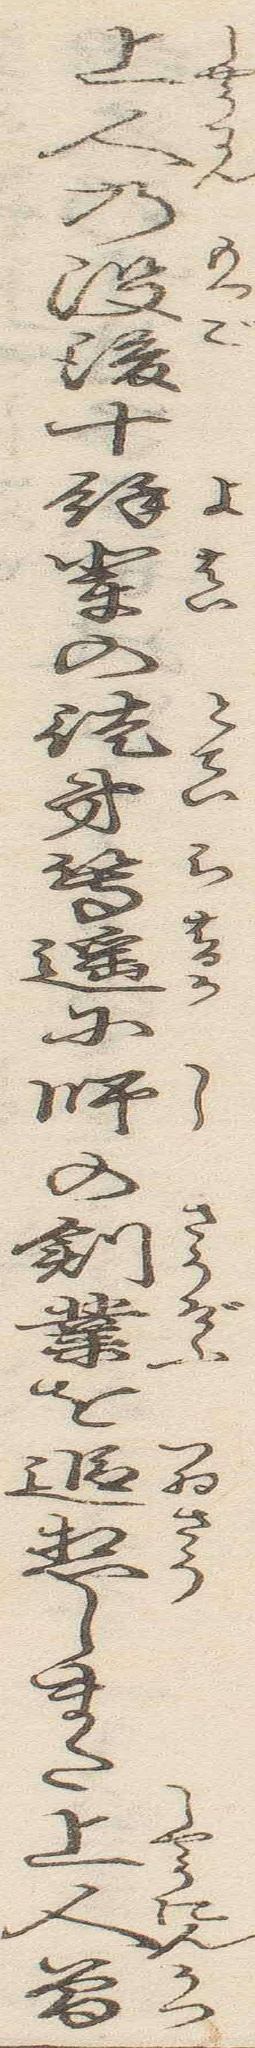上人の没後十餘輩の徒㐧等遥に師の創業を追想しまた上人曽
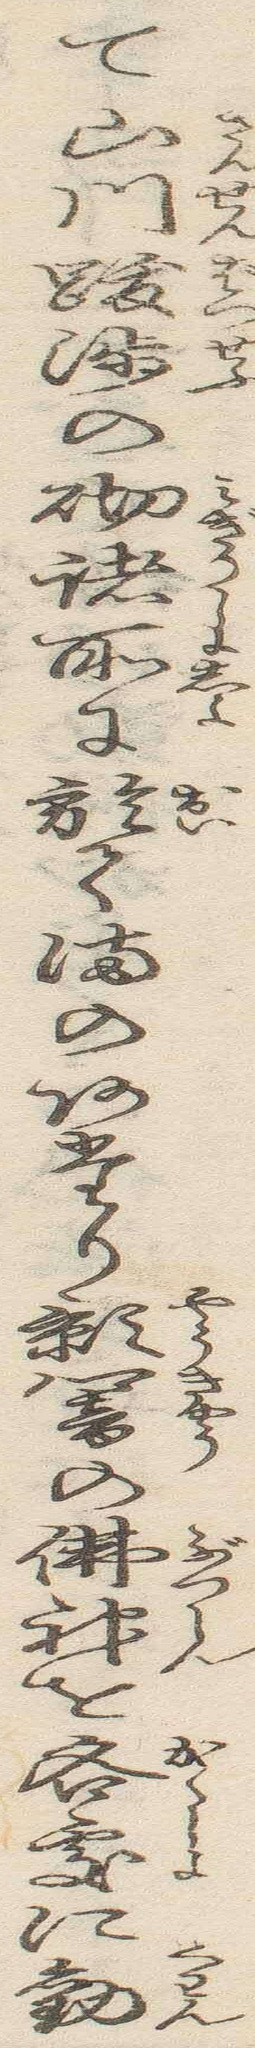て山川跋涉の砌諸所に於てまのあたり影響の佛神を各處に勸
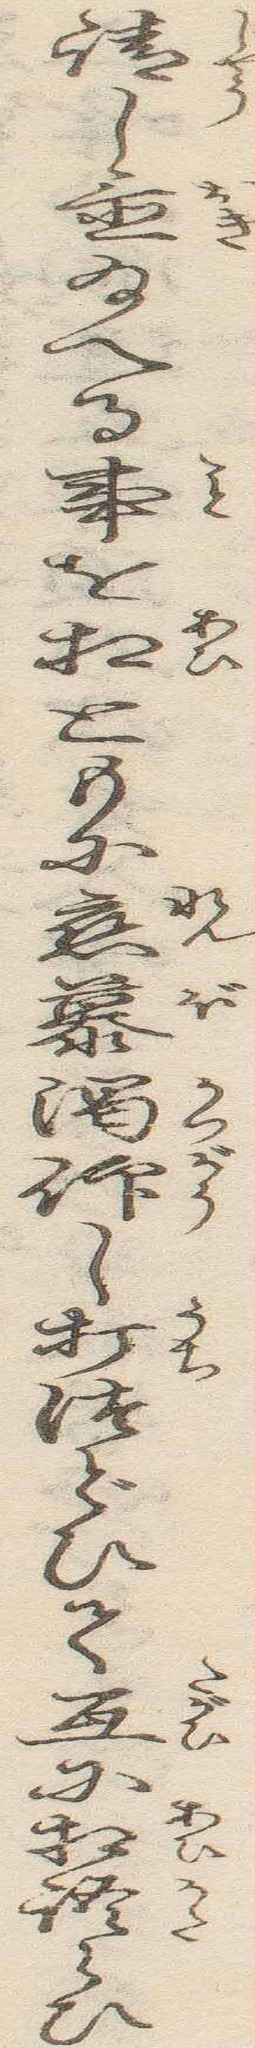請し置給へる事を相ともに恋慕渇仰し打つどひて互に相語らひ
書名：日光山志
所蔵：東京学芸大学附属図書館 国文学研究資料館
